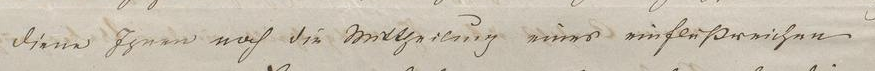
diene Ihnen noch die Mittheilung eines einflußreichen
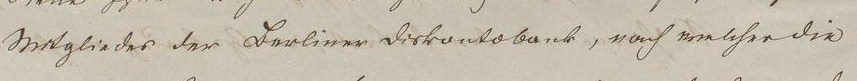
Mitgliedes der Berliner Diskontobank, nach welcher die
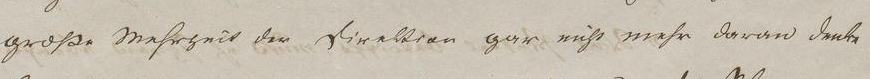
große Mehrheit der Direktion gar nicht mehr daran denke
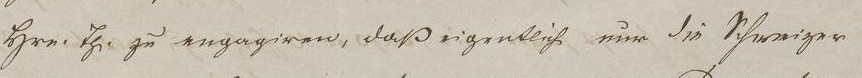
Hrn. Th. zu engagiren, daß eigentlich nur die Schweizer
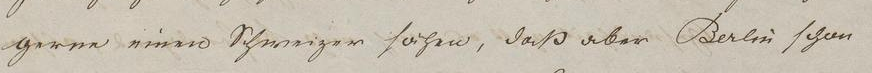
gerne einen Schweizer sähen, daß aber Berlin schon
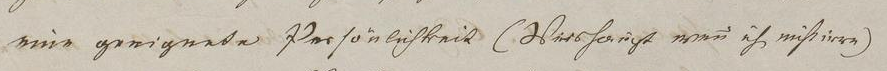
eine geeignete Persönlichkeit (Weishaupt wenn ich nicht irre)
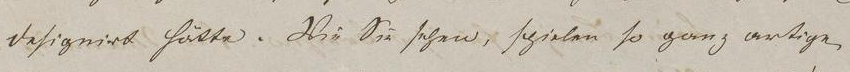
designirt hätte. Wie Sie sehen, spielen so ganz artige
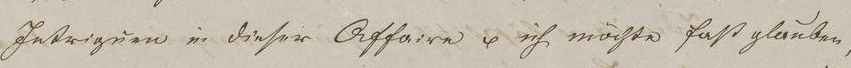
Intriguen in dieser Affaire & ich möchte fast glauben,
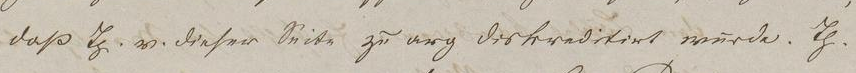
daß Th. v. dieser Seite zu arg diskreditirt wurde. Th.
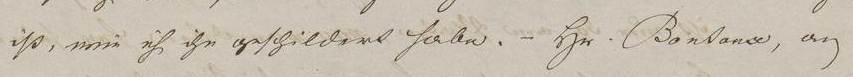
ist, wie ich ihn geschildert habe. – Hr. Bantaux , an
